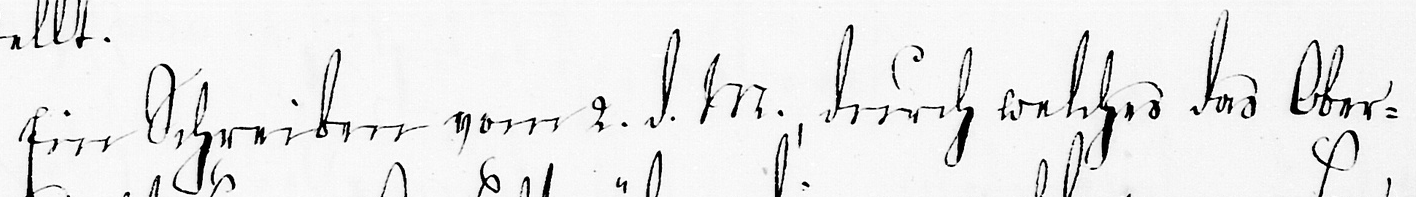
Ein Schreiben vom 2. d. M., durch welches das Ober¬
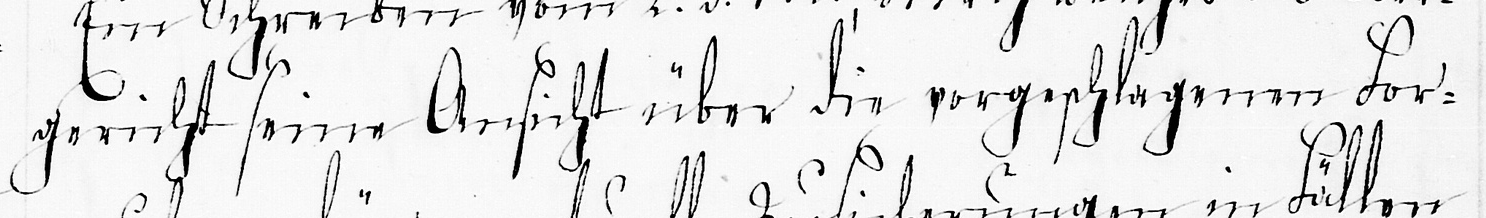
gericht seine Ansicht über die vorgeschlagenen For¬
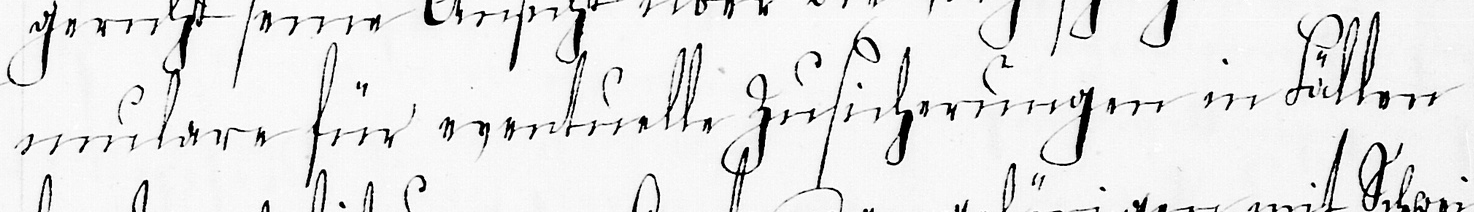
mulare für eventuelle Zusicherungen in Fällen
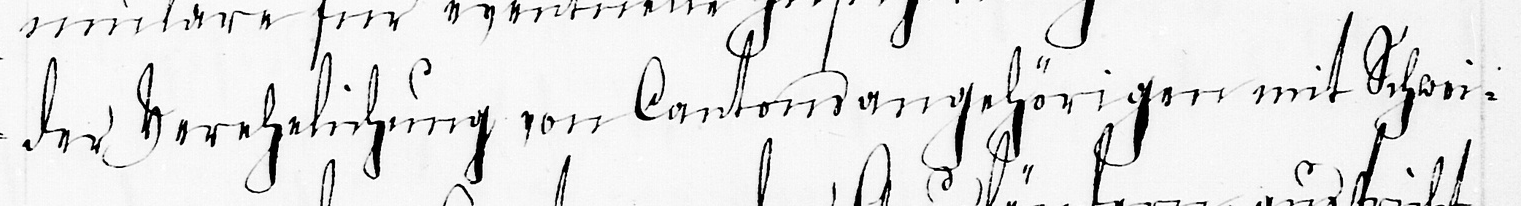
der Verehelichung von Cantonsangehörigen mit Schwei¬
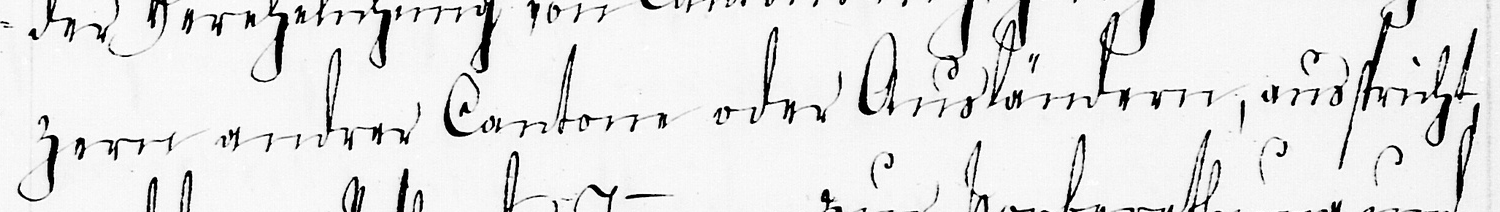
zern andrer Cantone oder Ausländern, ausspricht,
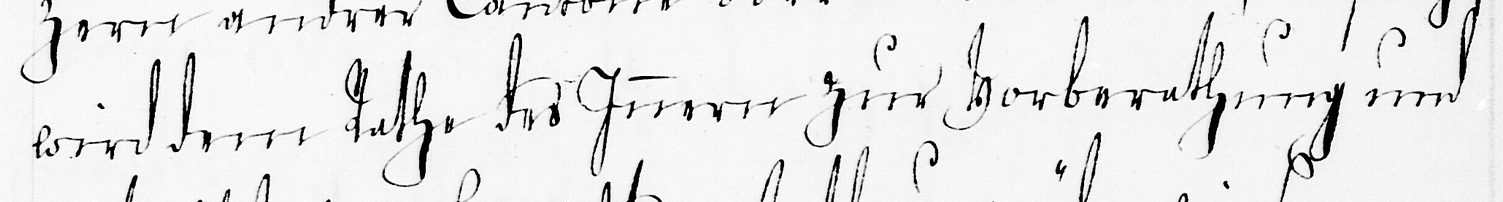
wird dem Rathe des Innern zur Vorberathung und
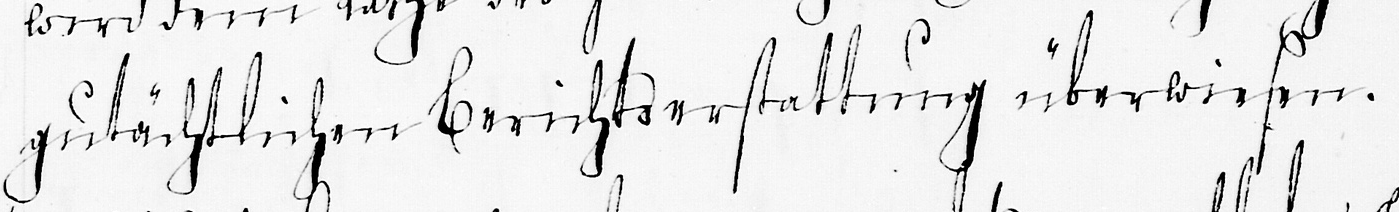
gutächtlichen Berichtserstattung überwiesen.
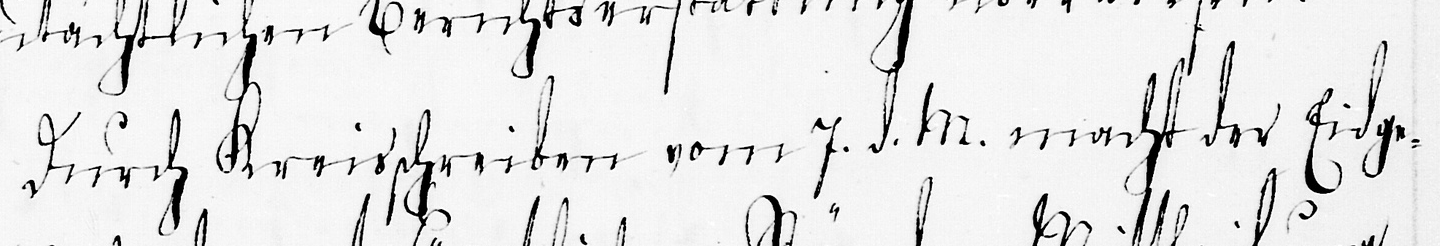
Durch Kreisschreiben vom 7. d. M. macht der Eidge¬
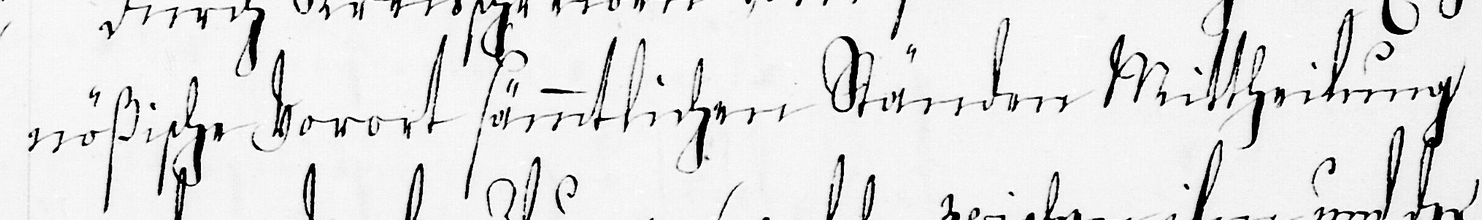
nößische Vorort sämmtlichen Ständen Mittheilung
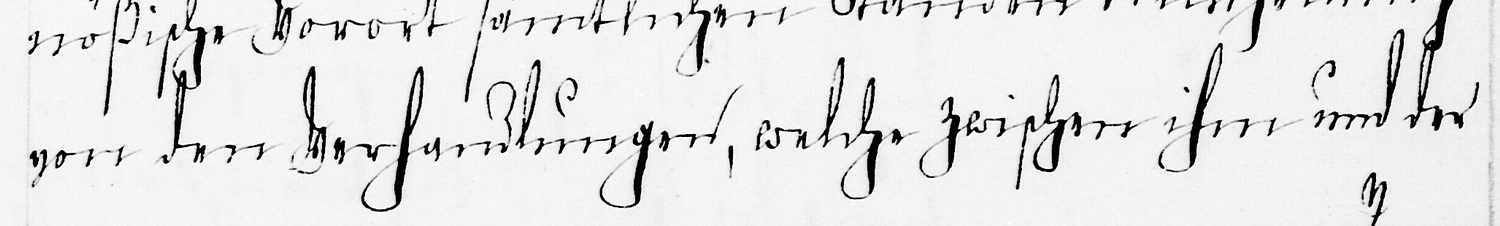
von den Verhandlungen, welche zwischen ihm und der
